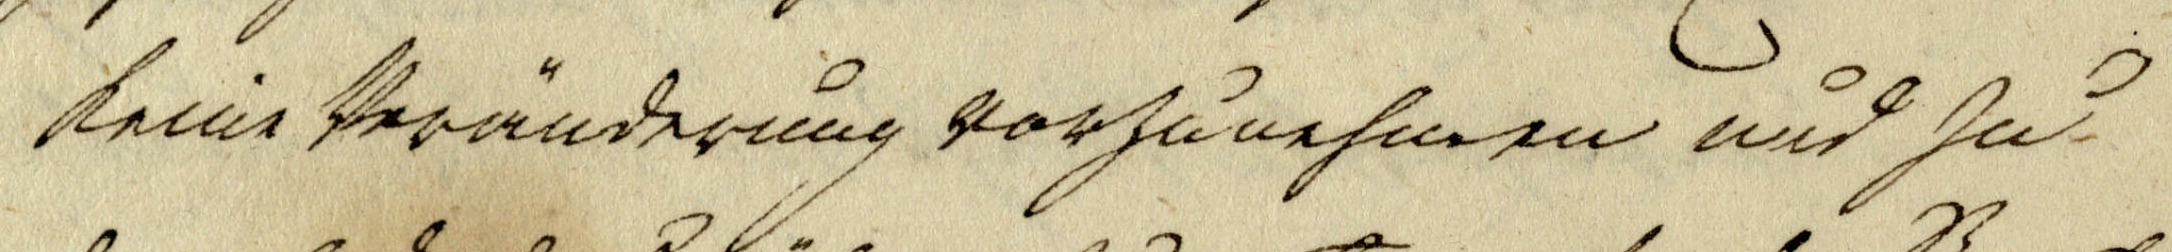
keine Veränderung vorzunehmen und zu
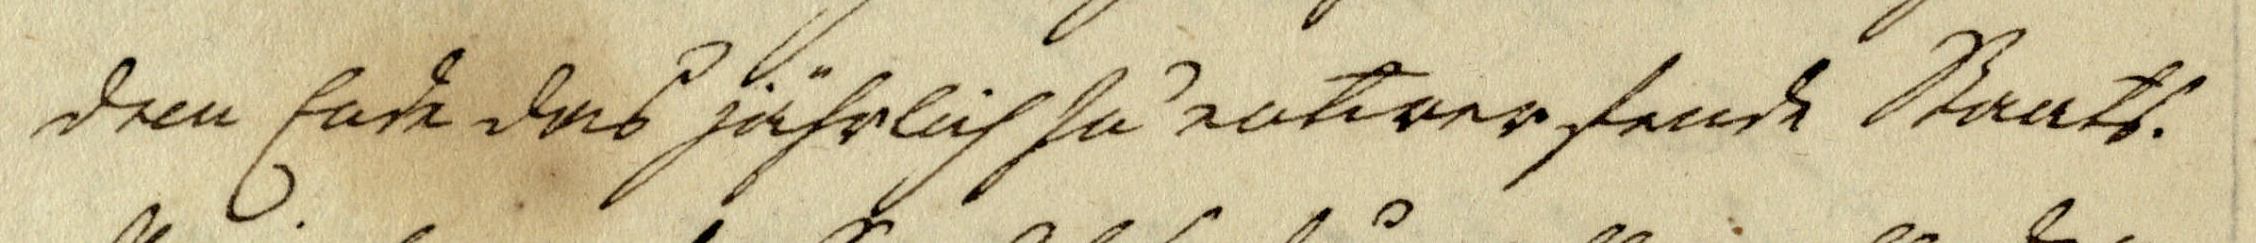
dem Ende das jährlich zu entwerfende Staats¬
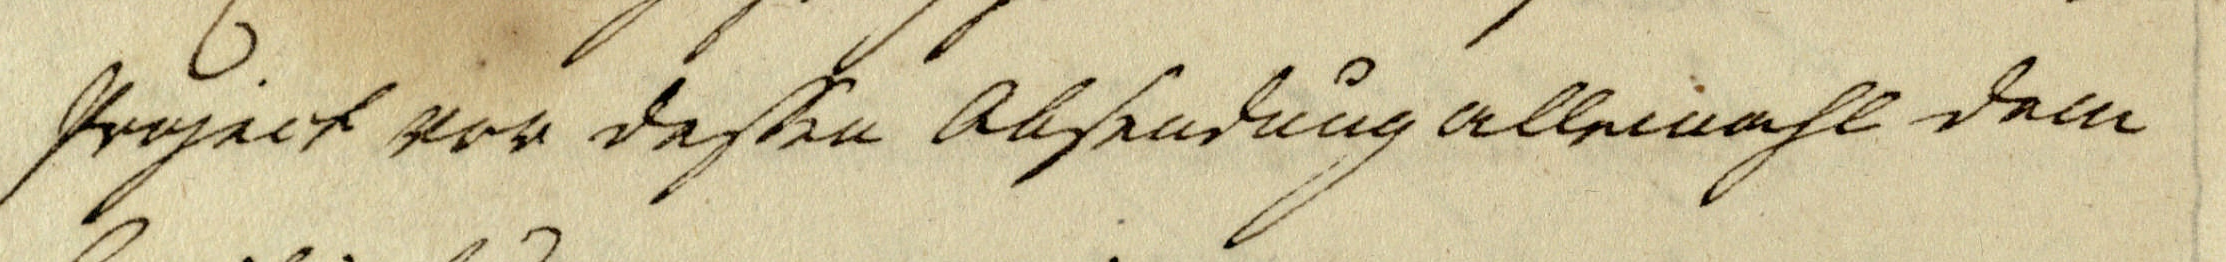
Project vor dessen Absendung allemahl dem
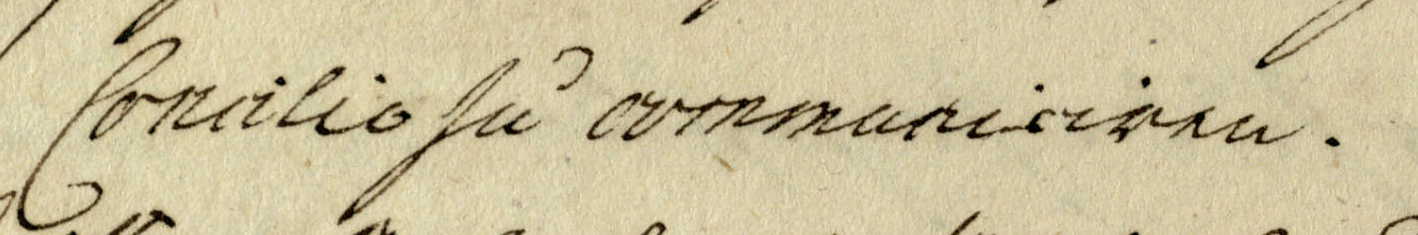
Concilio zu communiciren.
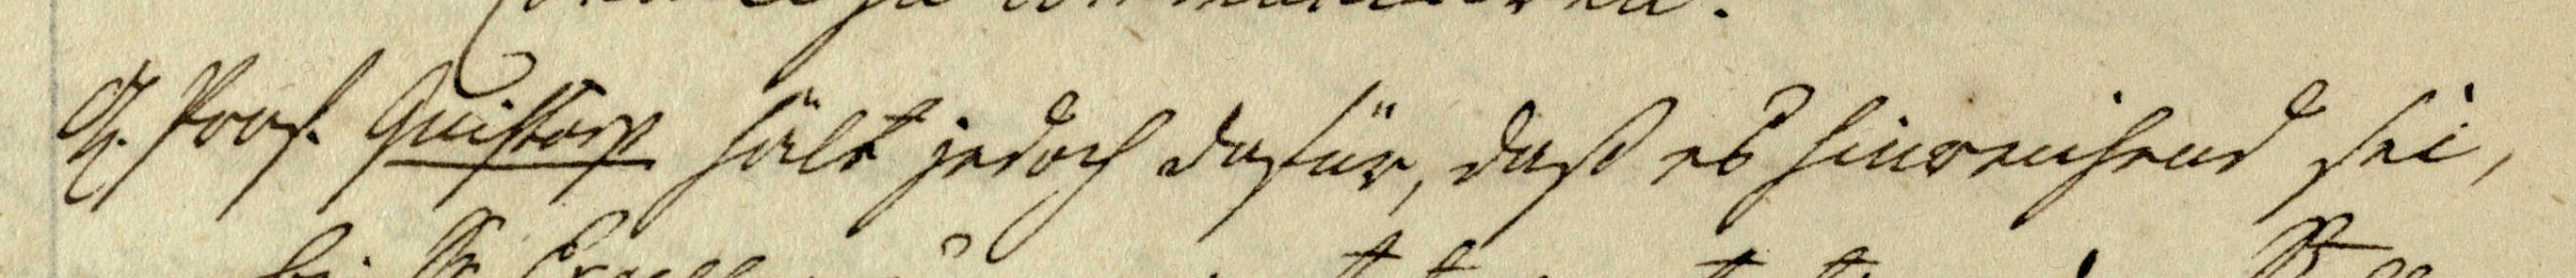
dh. Prof Quistorp hält jedoch dafür, daß es hinreichend sei,
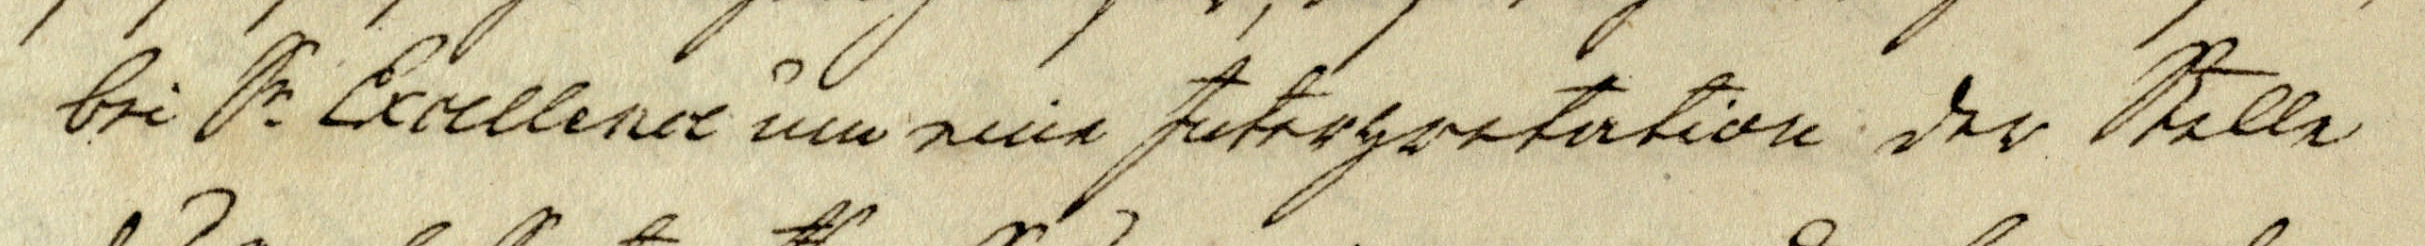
bei Sr Excellence um eine Interpretation der Stelle
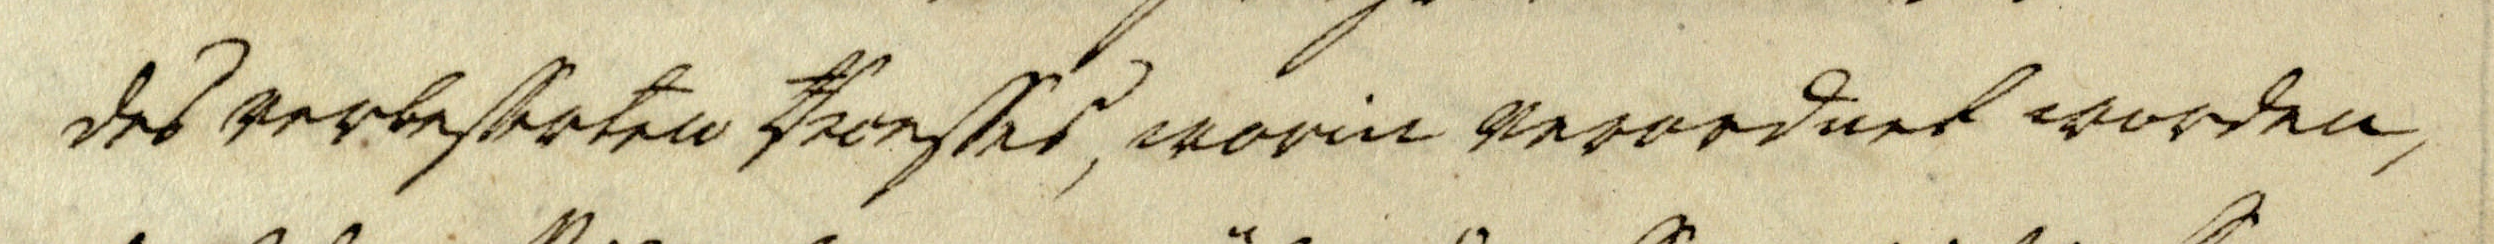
des verbesserten Recesses, worin verordnet worden,
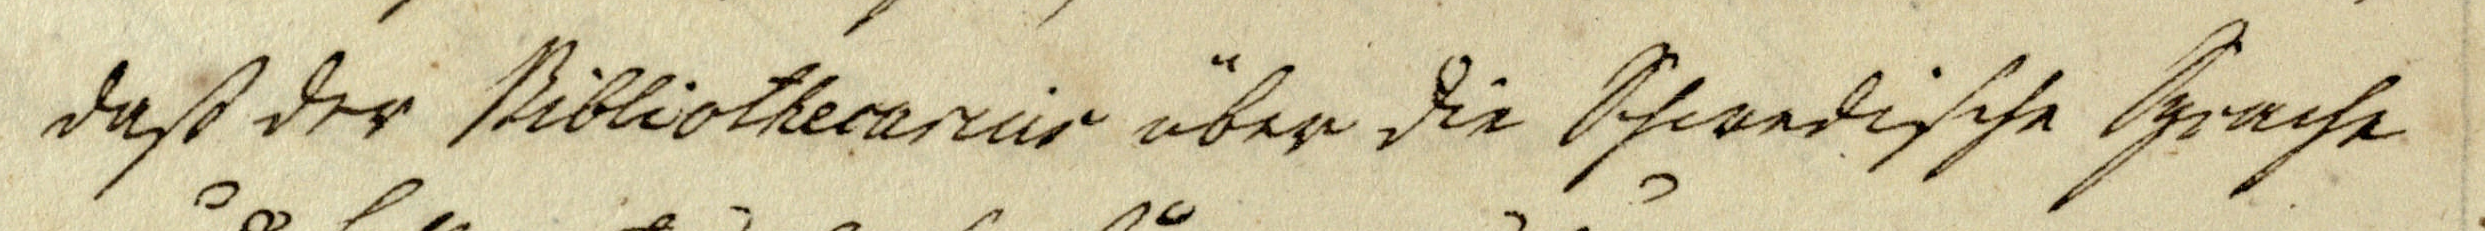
daß der Bibliothecarius über die Schwedische Sprache
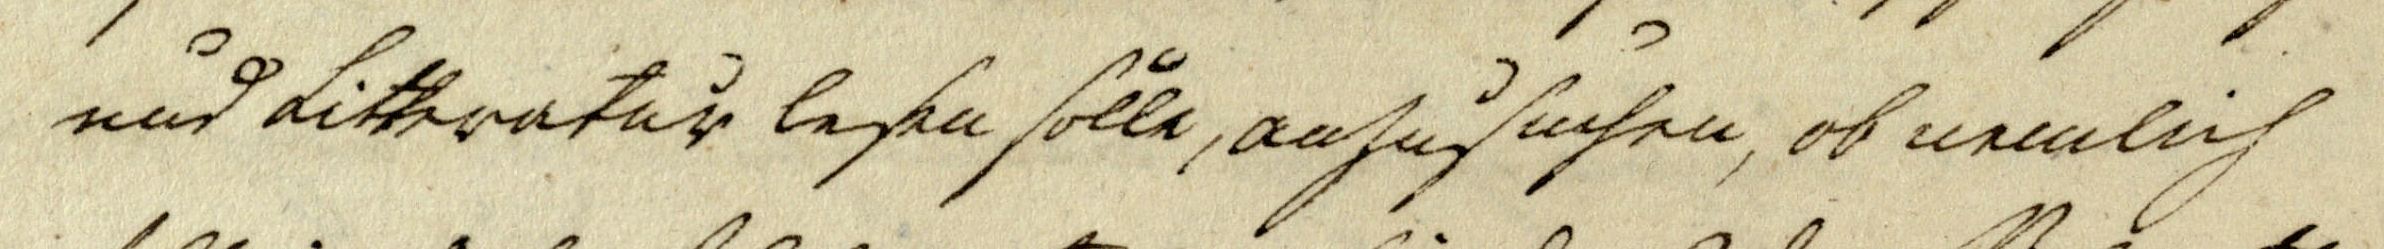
und Litteratur lesen solle, anzusuchen, ob nemlich
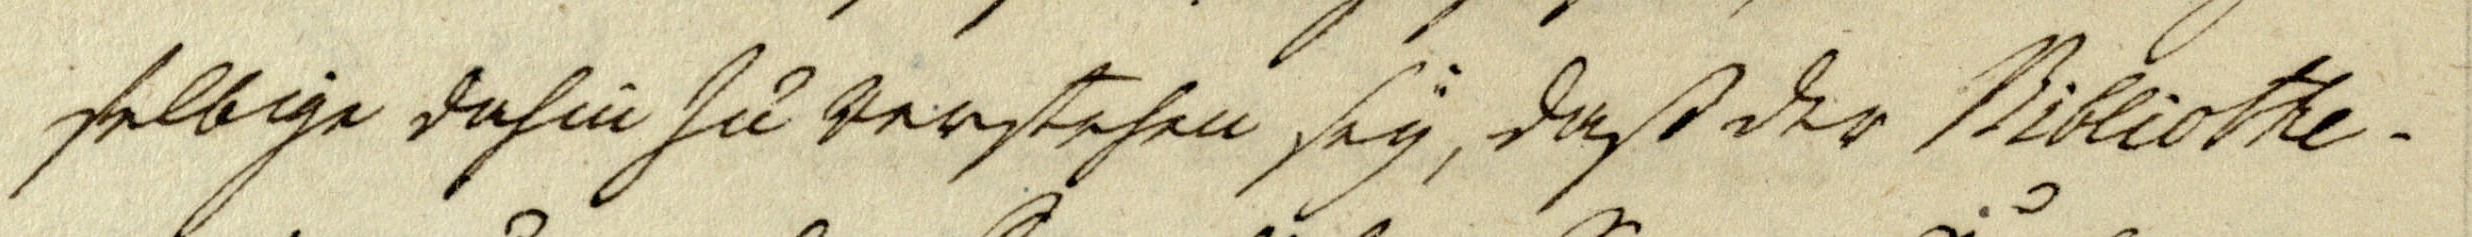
selbige dahin zu verstehen seÿ, daß der Bibliothe¬
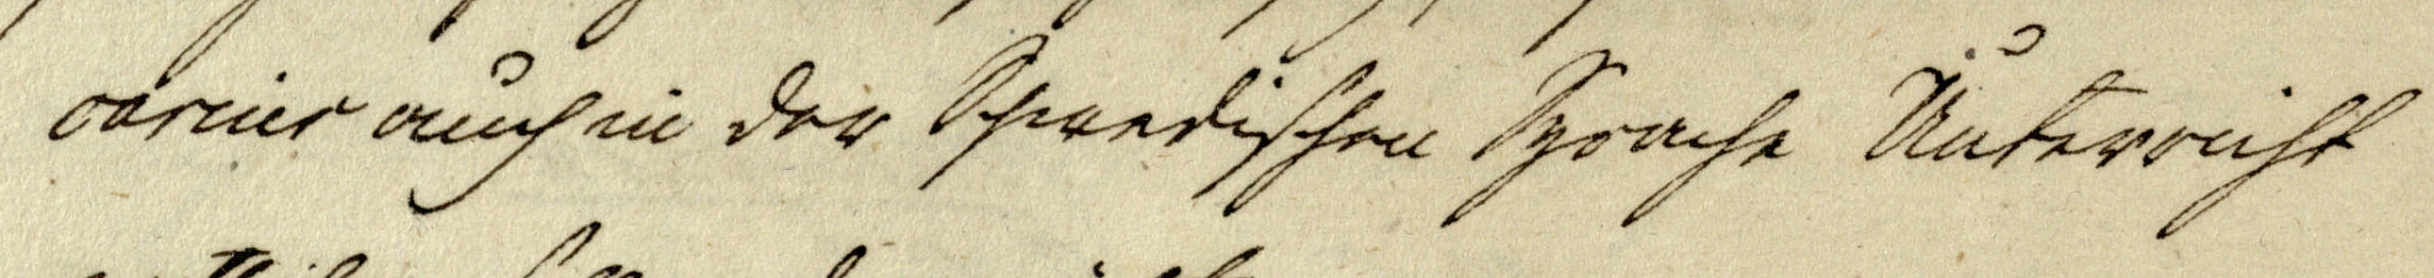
carius auch in der Schwedischen Sprache Unterricht
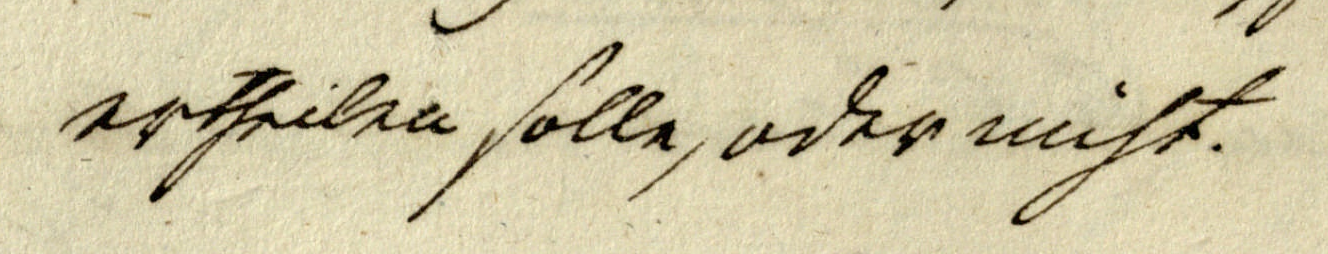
ertheilen solle, oder nicht.
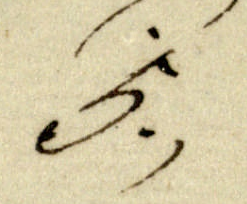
5.,
